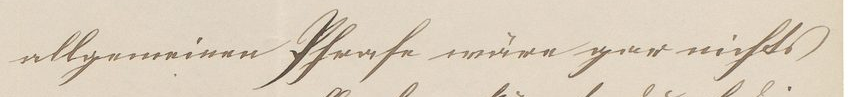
allgemeinen Phrase wäre gar nichts
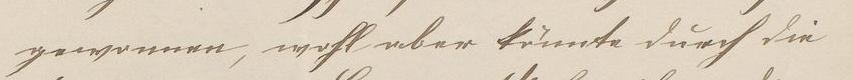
gewonnen, wohl aber könnte durch die
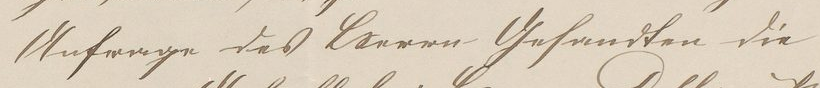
Anfrage des Herrn Gesandten die
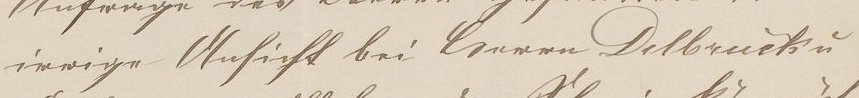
irrige Ansicht bei Herrn Delbrück u
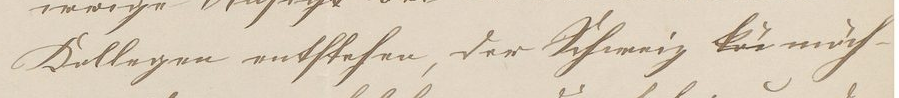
Kollegen entstehen, der Schweiz kön möch-
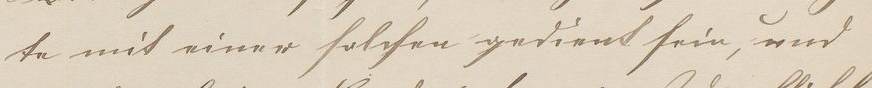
te mit einer solchen gedient sein, und
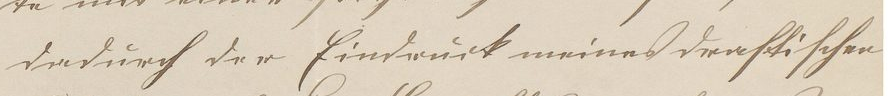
dadurch der Eindruck meines drastischen
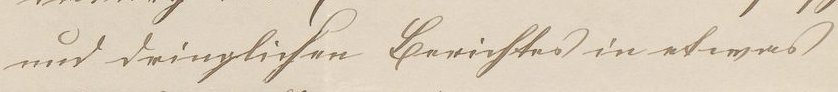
und dringlichen Berichtes in etwas
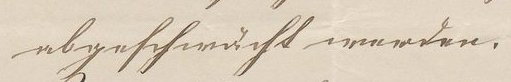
abgeschwächt werden.
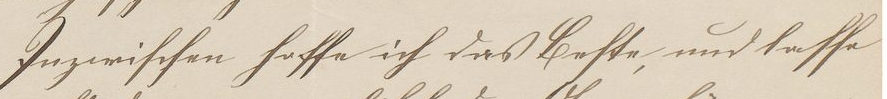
Inzwischen hoffe ich das Beste, und lasse
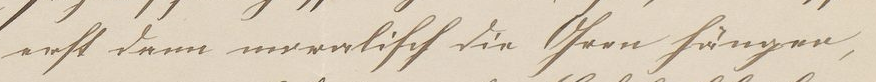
erst dann moralisch die Ohren hängen,
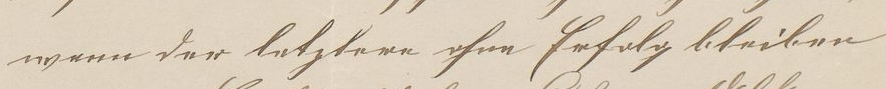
wenn der letztere ohne Erfolg bleiben
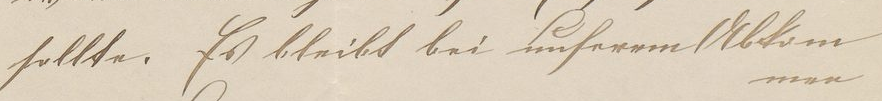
sollte. Es bleibt bei unserem Abkom-
